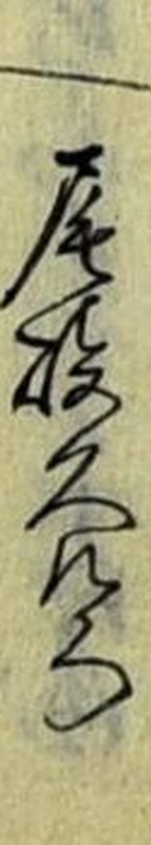尾崎久左衛門
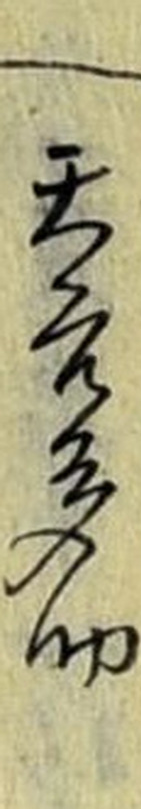天谷多助
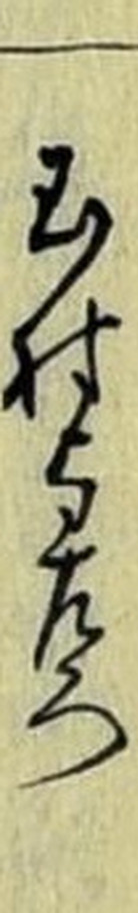玉村与左衛門
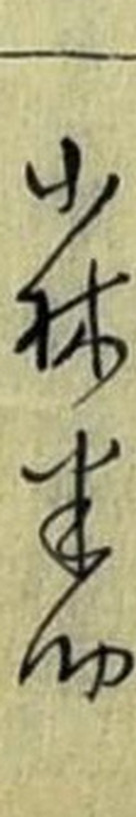小林半助
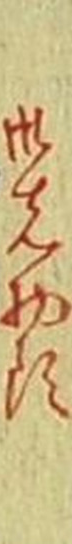御先物頭
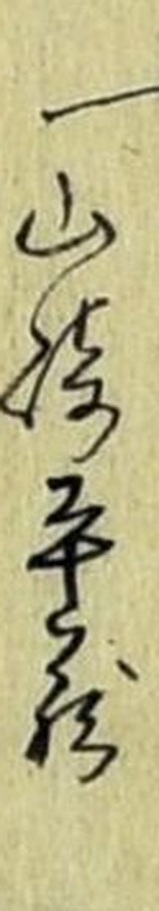山崎平蔵
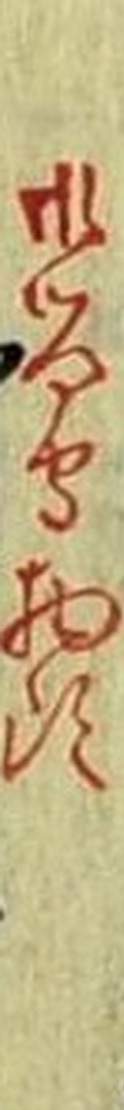御留守物頭
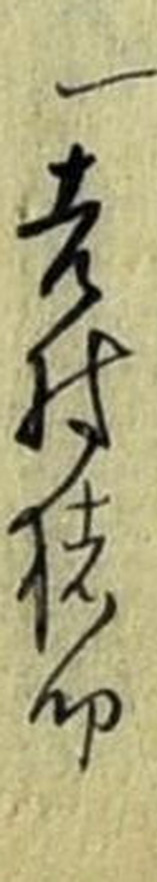吉村猪助
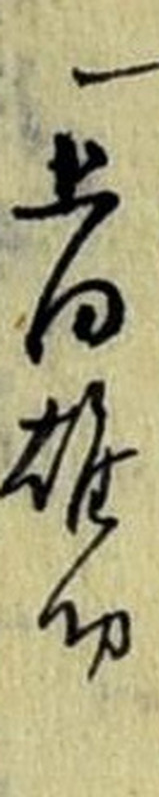上田雄助
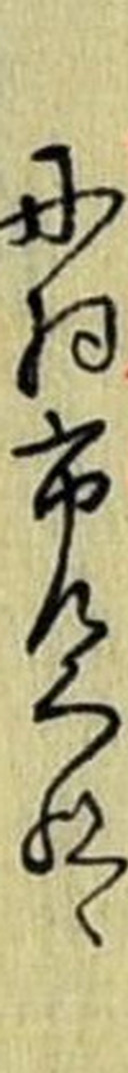丹羽市左衛門組へ
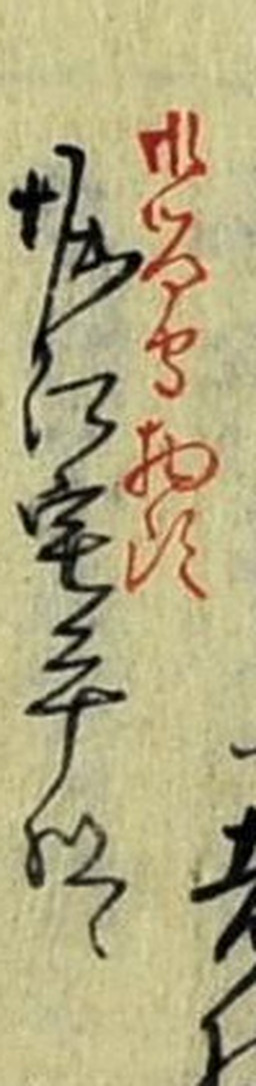堀江宅平組へ
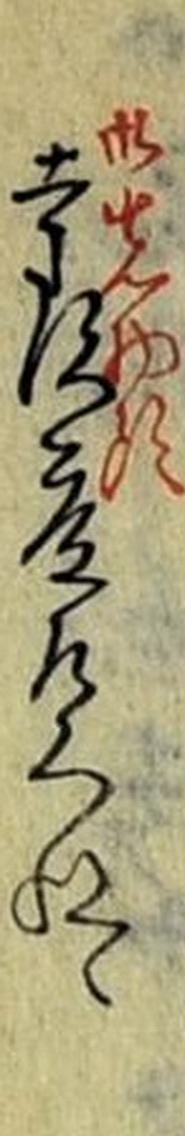寺沢藤左衛門組へ
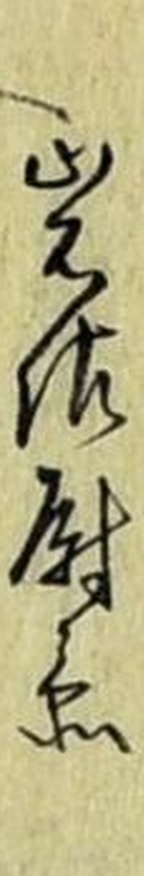岩佐尉兵衛
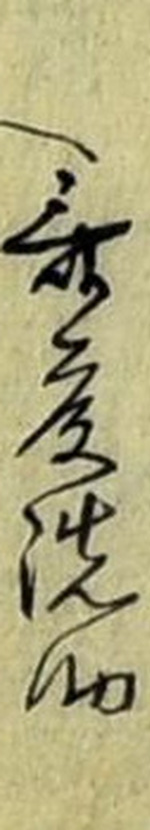斉藤洗助
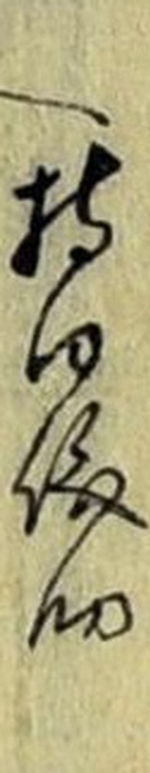持田儀助
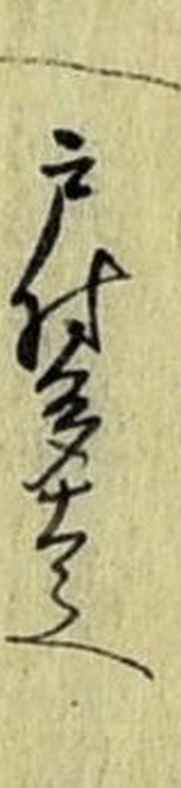戸村多太夫
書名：命令之部 四
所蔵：福井県文書館 Fukui Prefectural Archives
